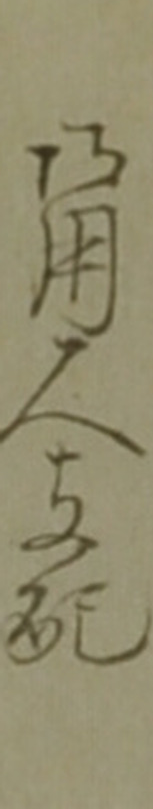御用人支配
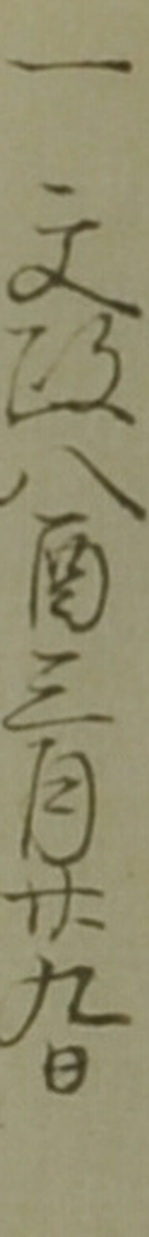一文政八酉三月廿九日

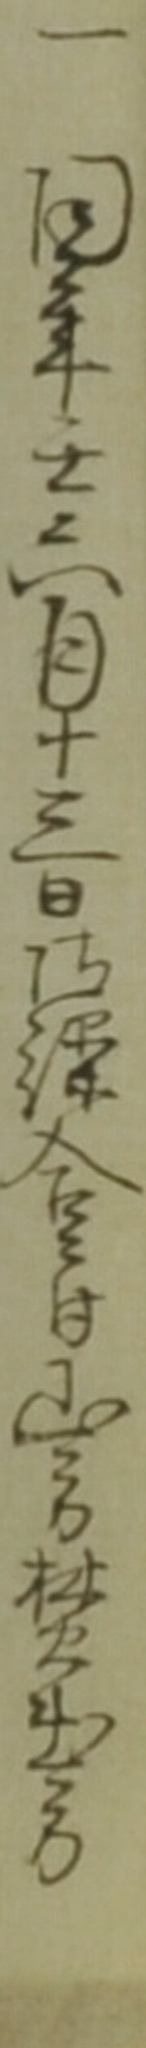一同年閏六月十三日御繰合ニ付山方焚出方
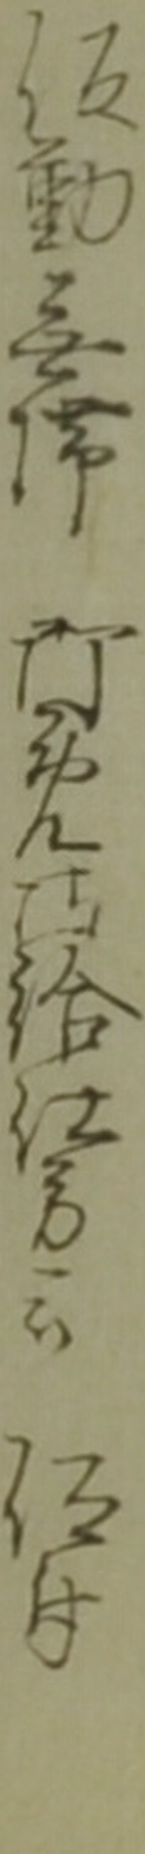仮勤無滞御免御給仕方被仰付
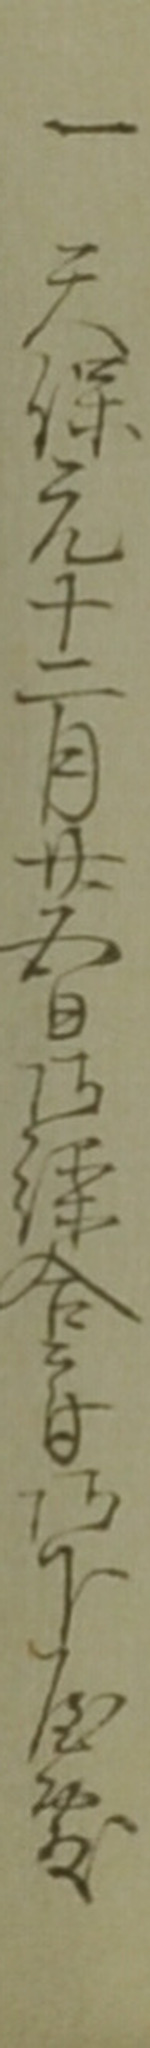一天保元十二月廿五日御繰合ニ付御下屋敷
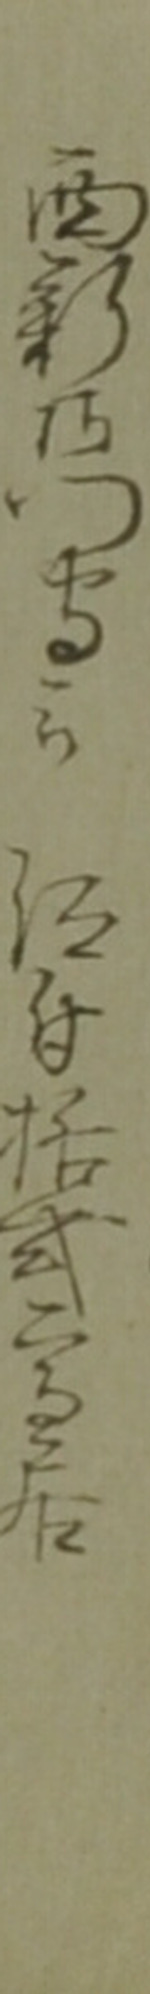西新御門守被仰付格式高居
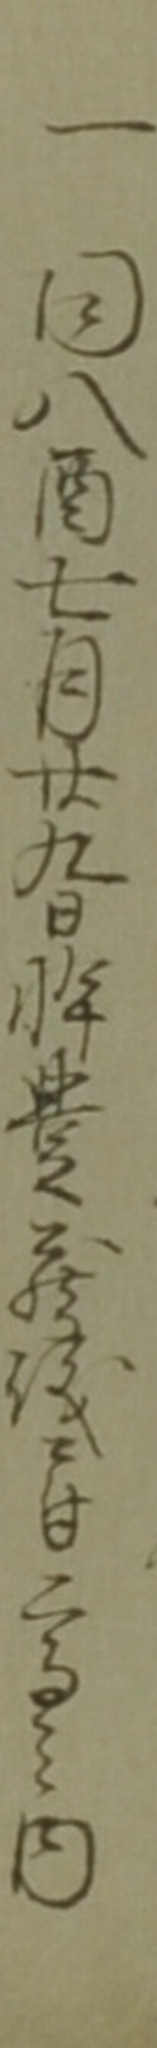一同八酉七月廿九日忰豊蔵儀ニ付高之内
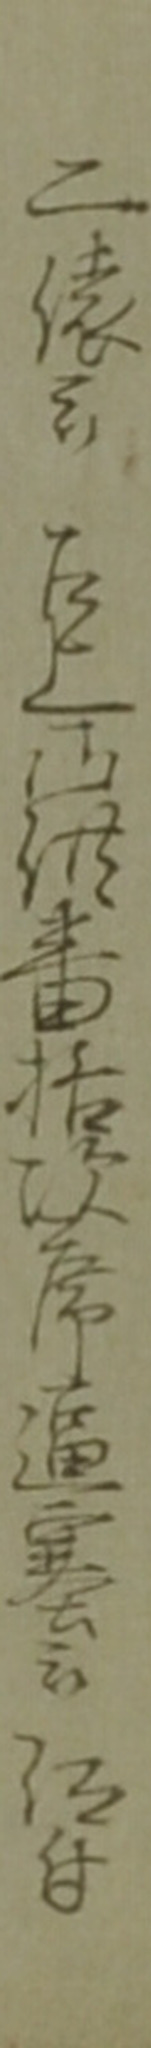二俵被召上御供番格次席逼塞被仰付
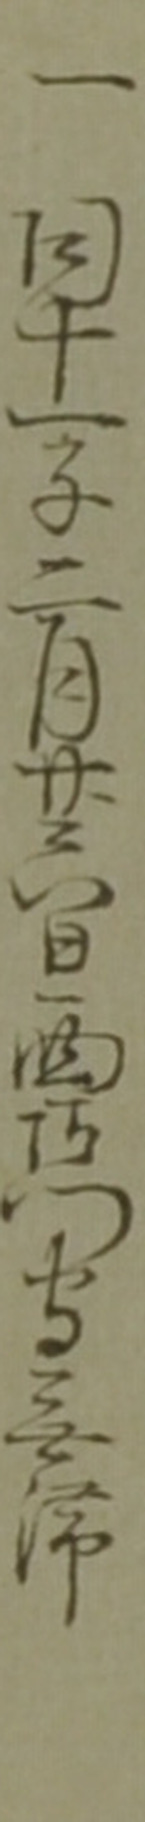一同十一子二月廿六日西御門守無滞
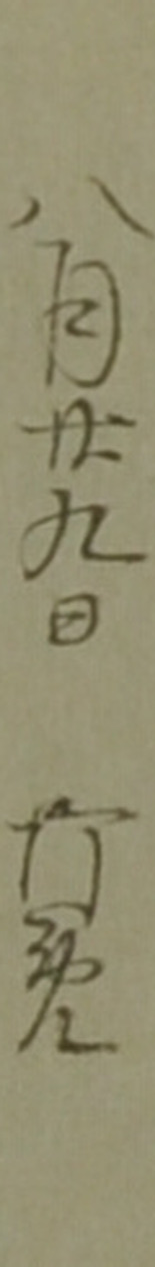八月廿九日御免
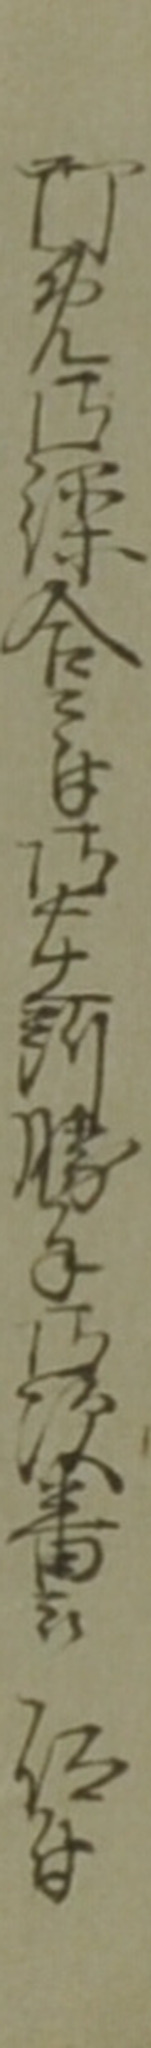御免御繰合ニ付御在所勝手御次番被仰付
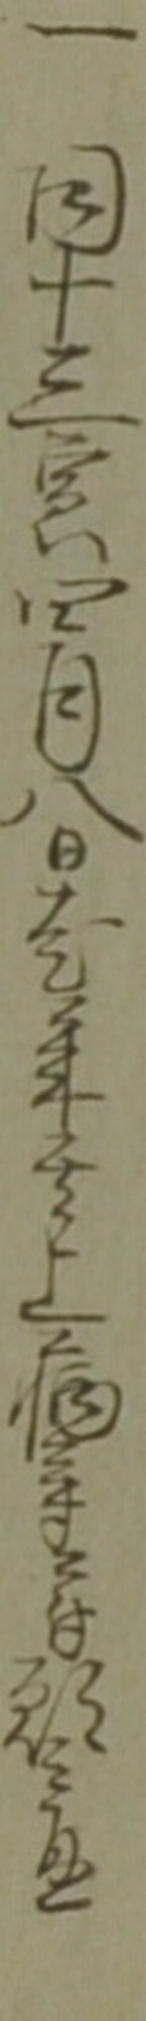一同十三寅四月八日老年其上病気ニ付願之通
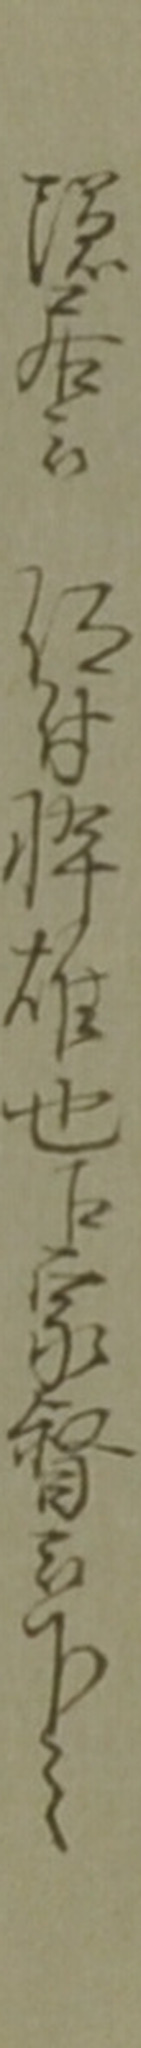隠居被仰付忰雄也江家督被下之
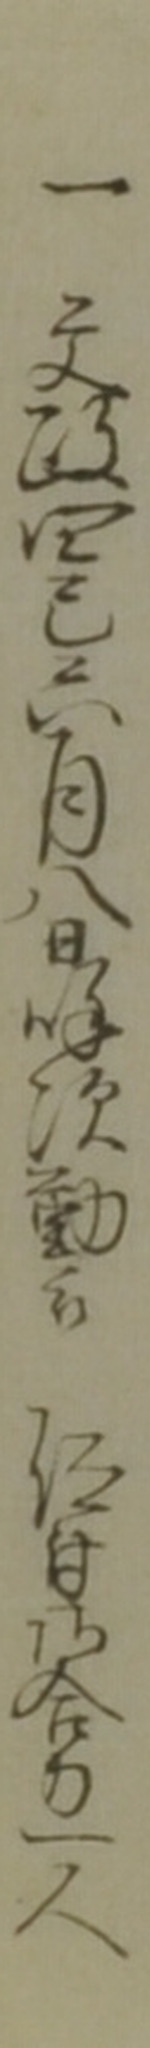一文政四巳六月八日呼次勤被仰付御合力一人
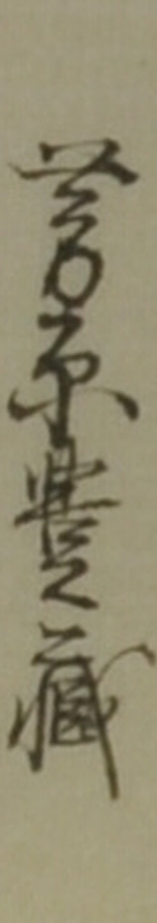芳原豊蔵
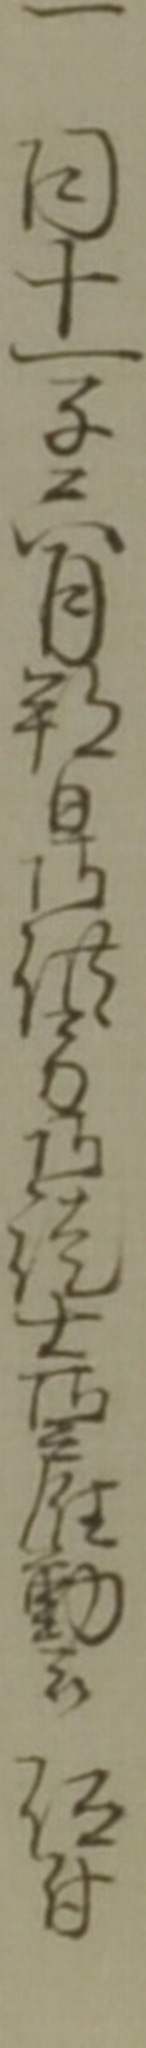一同十一子六月朔日御供方御徒士御雇勤被仰付
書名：無足諸士勤仕録（五）
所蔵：伊那市立高遠町図書館・合同会社AMANE
